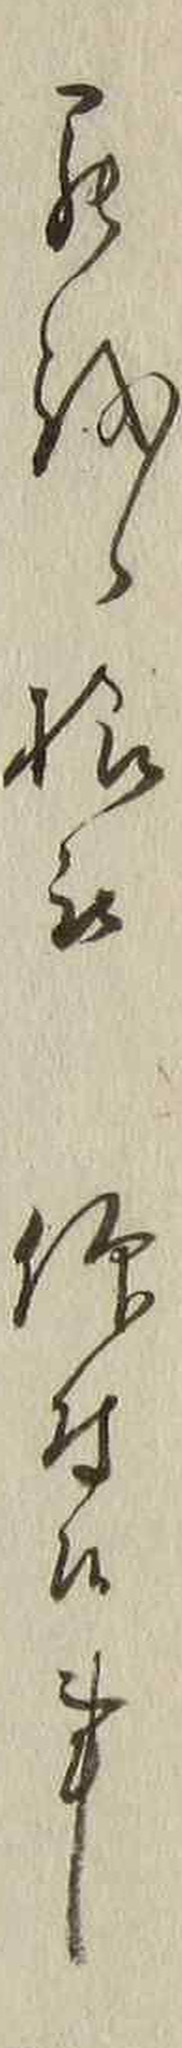罷越候様被仰付候事
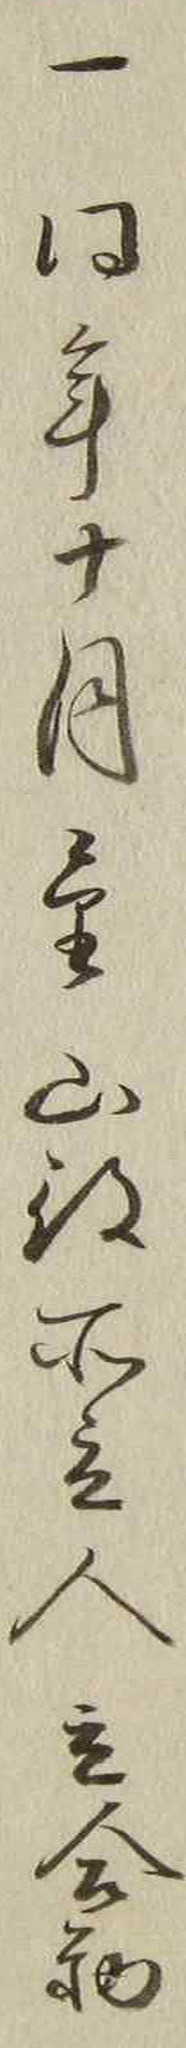一同年十月金山役所立人立合勤
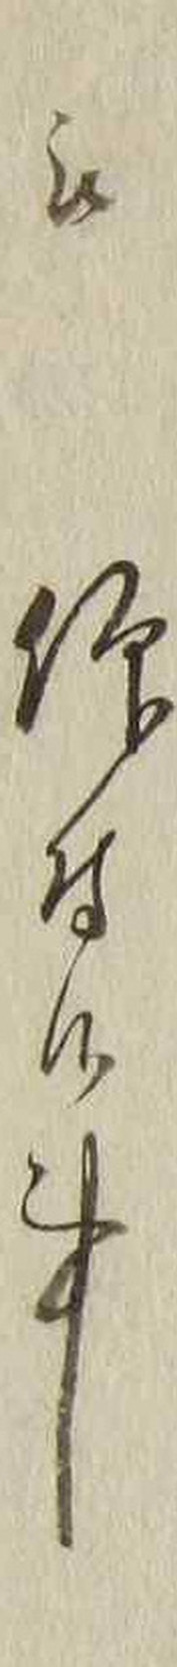被仰付候事
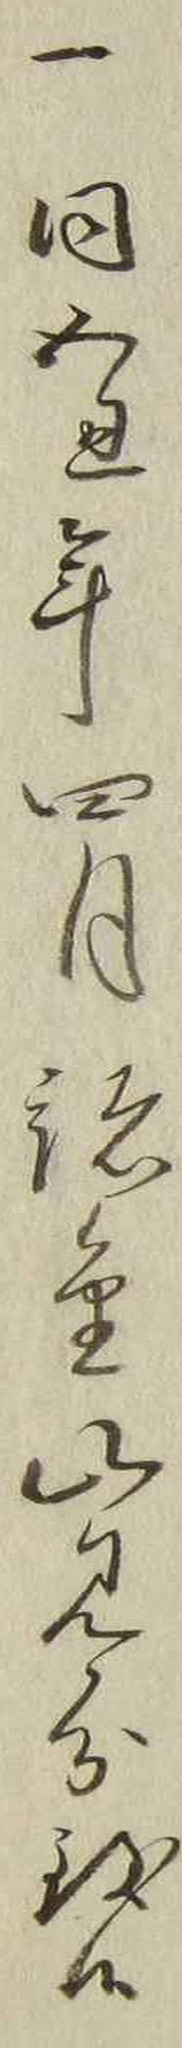一同五丑年四月諸金山見分致候

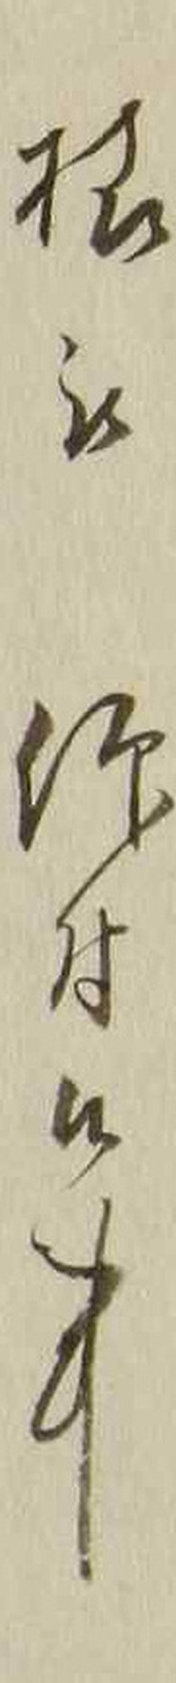様被仰付候事
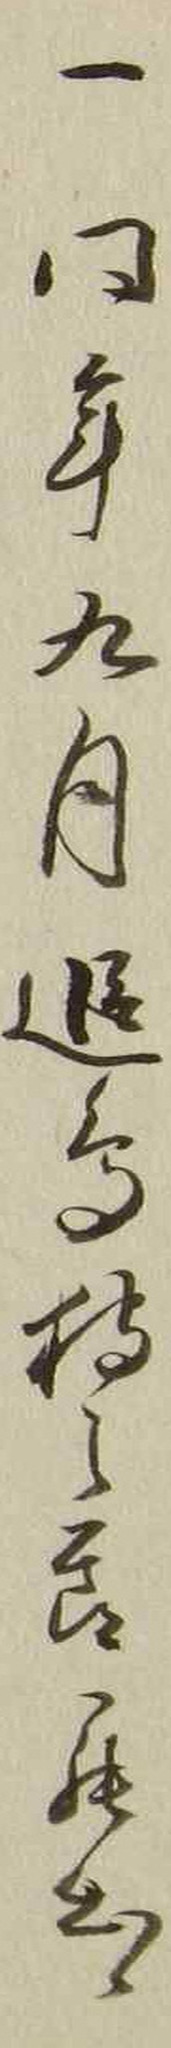一同年九月追鳥狩之節罷出候
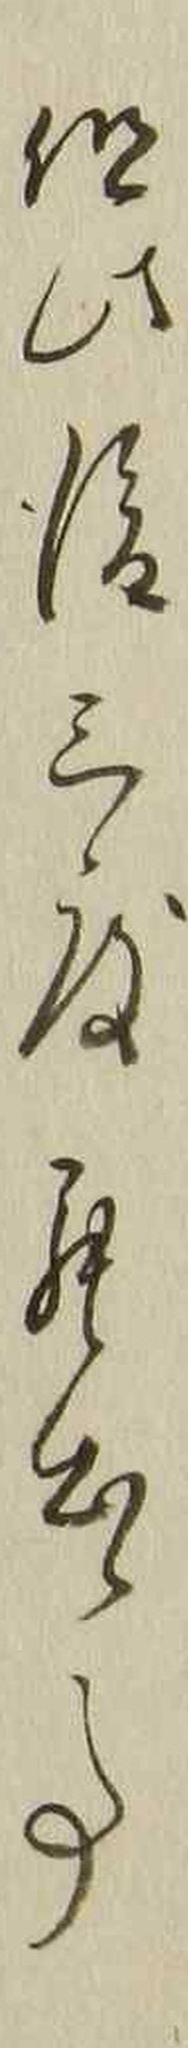但此後三度罷出候事
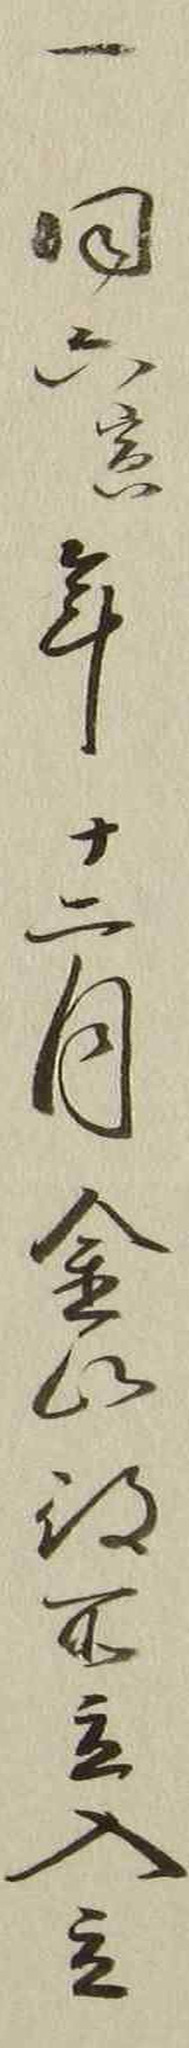一同六寅年十二月金山役所立入立
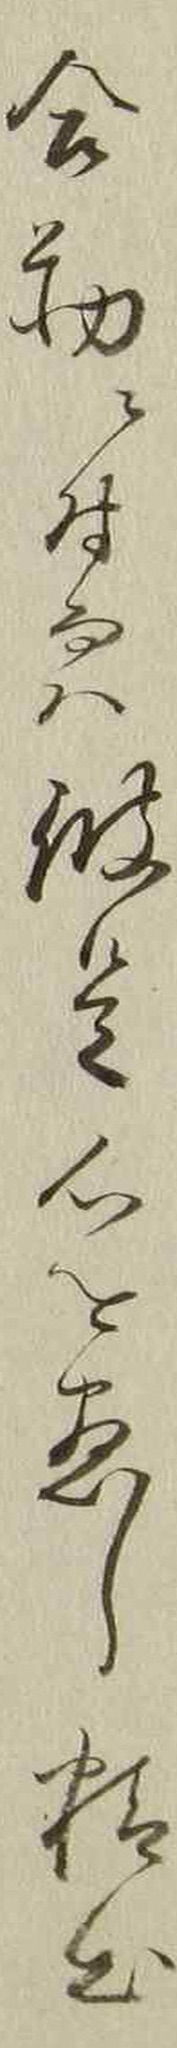合勤ニ付而ハ彼是心を尽し精出
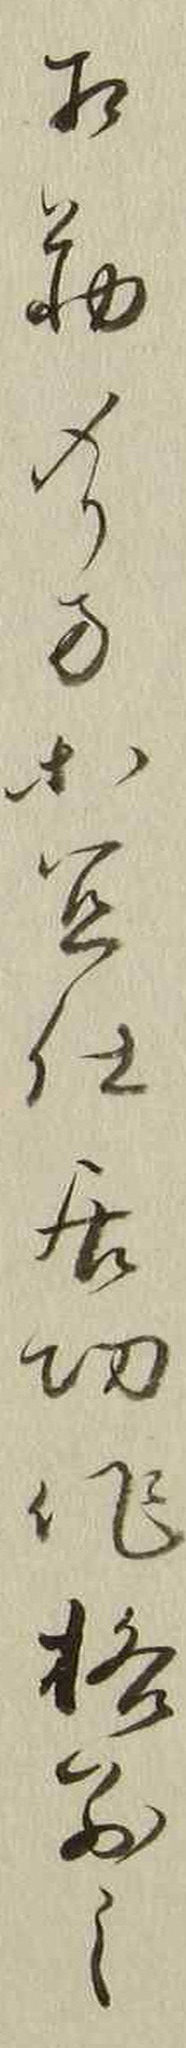相勤〆り方等宜仕居功作格別之
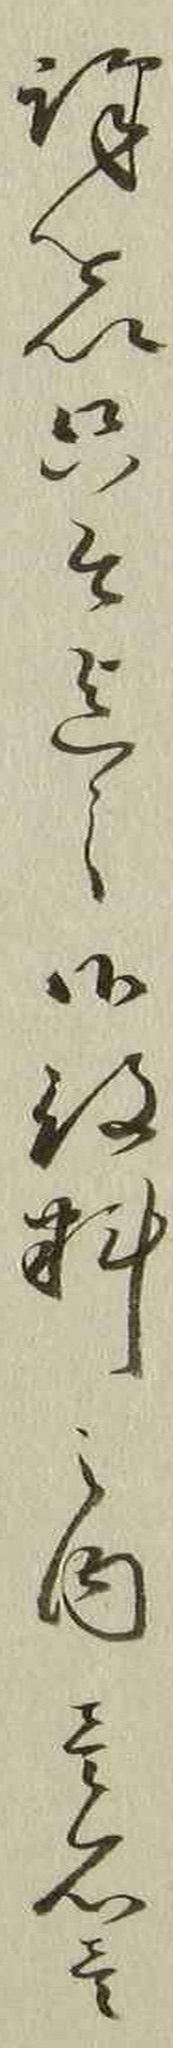訳を以只今迄之御役料之内壱石壱
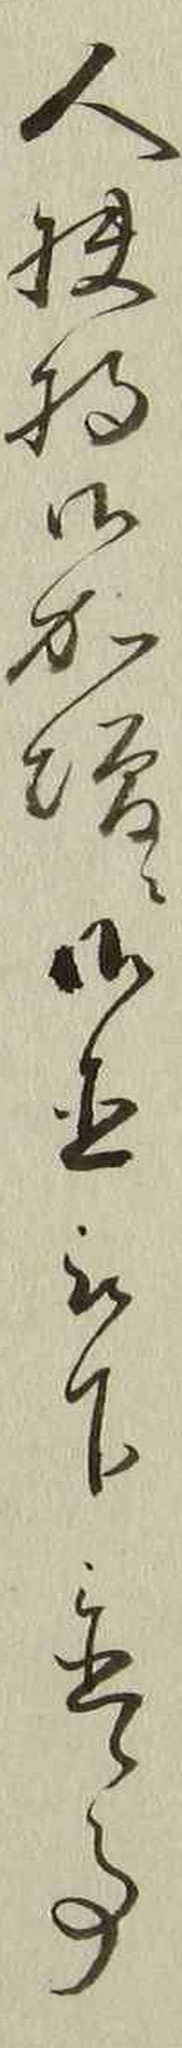人扶持御加増ニ御直被下置候事
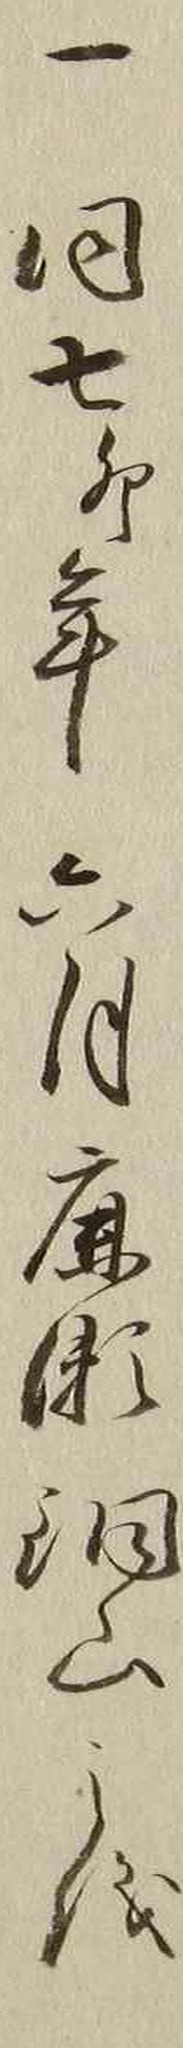一同七卯年六月鹿瀬銅山之儀
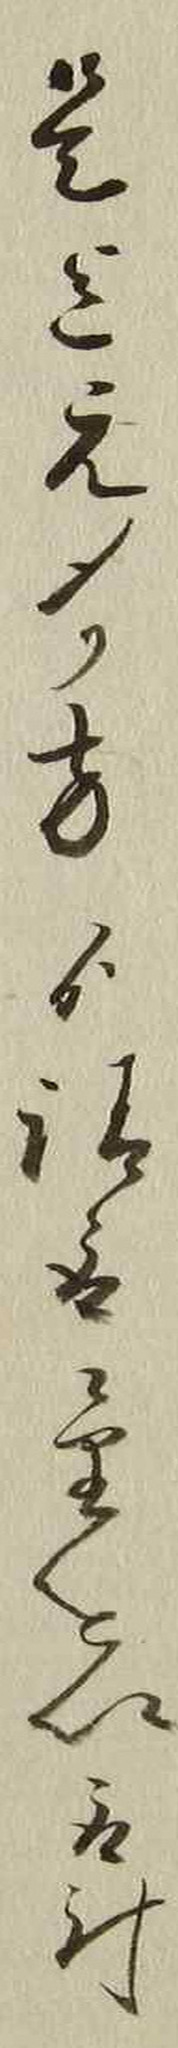是迄元〆り方ゟ請取金を以取計
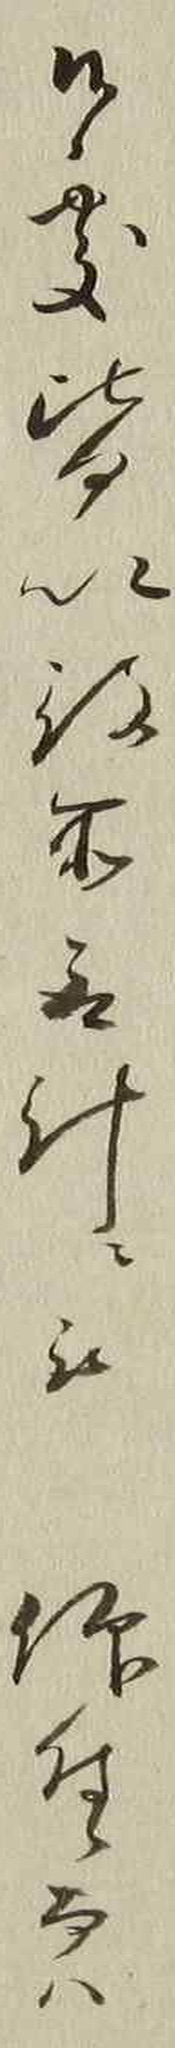候処皆以役所取計ニ被仰付候而ハ
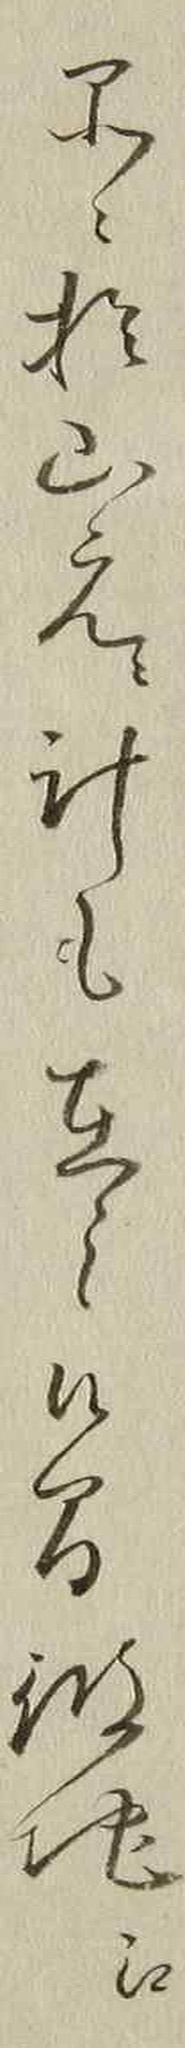品々於山元ニ計も在之候間彼地江
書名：諸士系譜　巻之52　に之部3
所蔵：会津若松市立会津図書館
